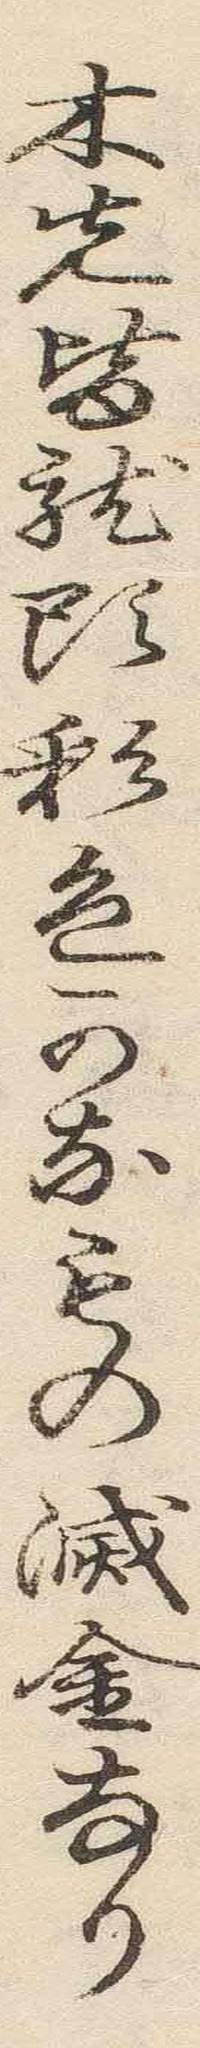木先皆龍頭彩色かなもの滅金なり
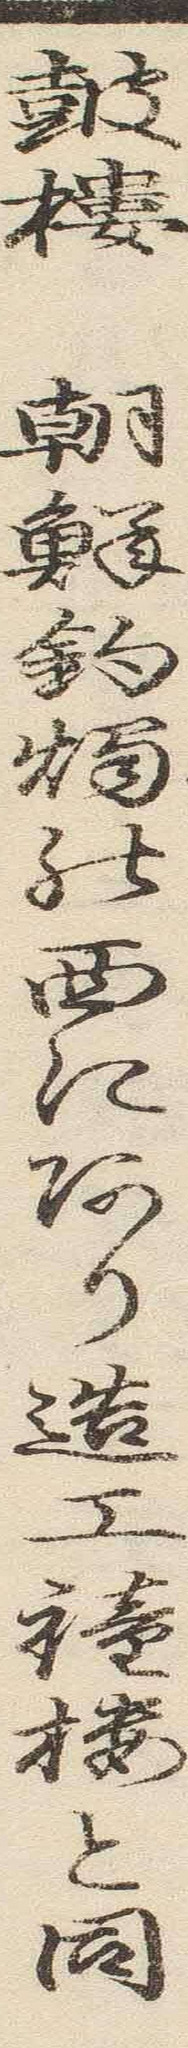皷樓朝鮮釣燭の西にあり造工鐘楼と同
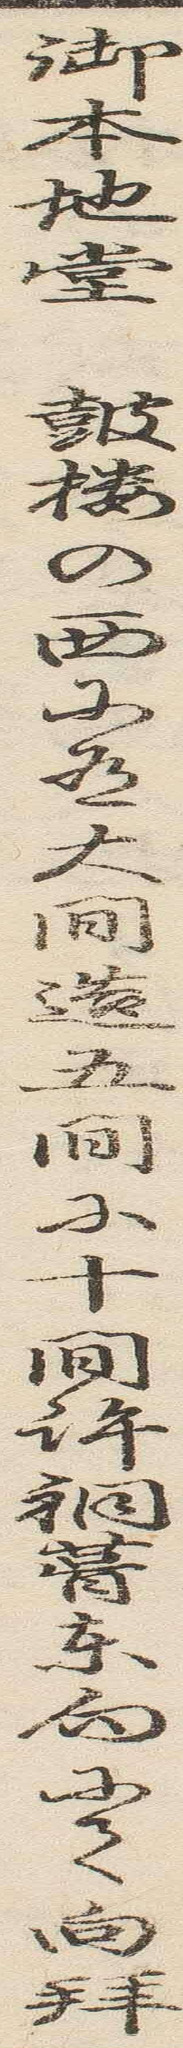御本地堂皷楼の西に有大間造五間に十間許銅葺東向にて向拜
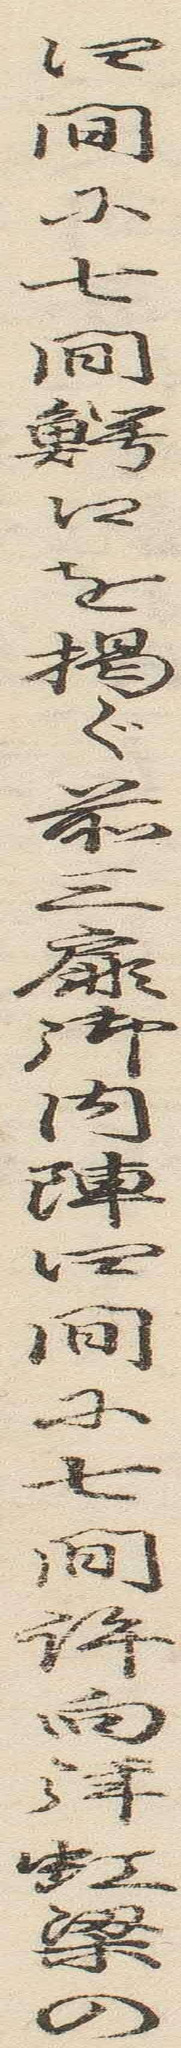四間に七間鰐口を掲ぐ前三扉御内陣四間に七間許向拜虹梁の
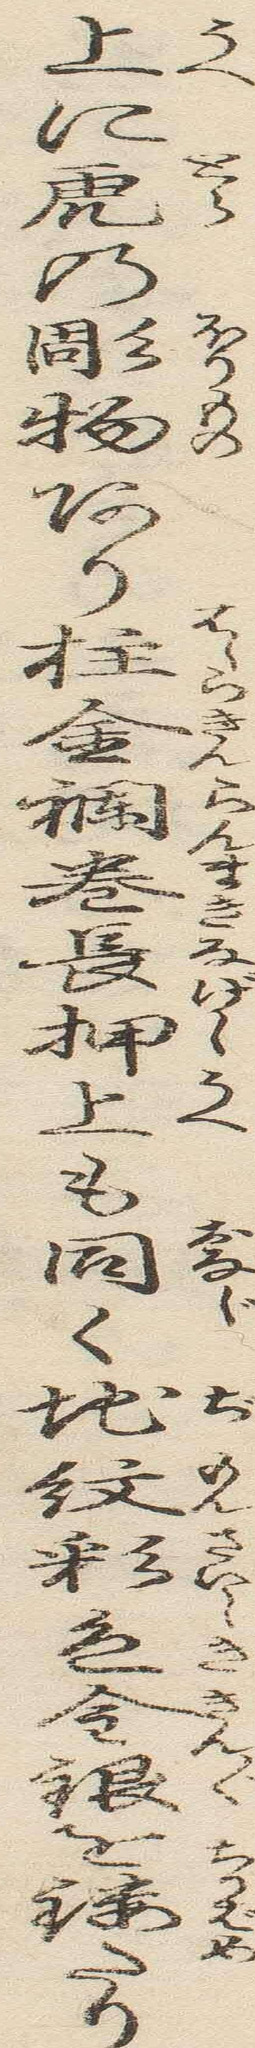上に虎の彫物あり柱金襴巻長押上も同く地紋彩色金銀を鏤たり
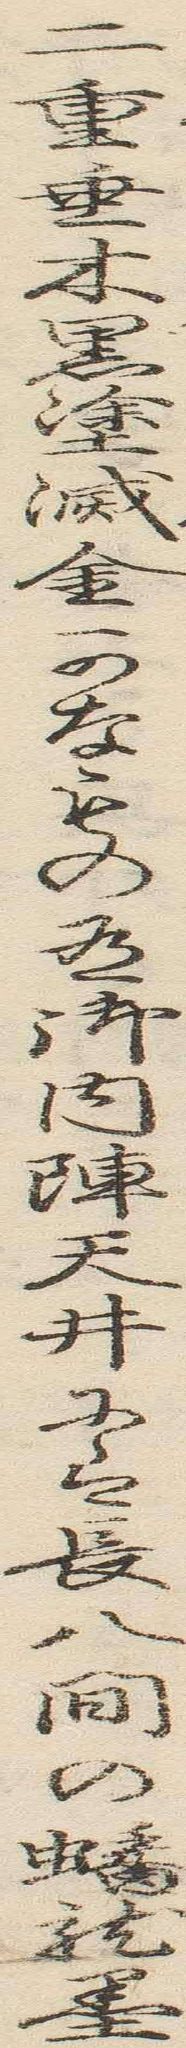二重垂木黒塗滅金かなもの有御内陣天井には長八間の蟠龍墨
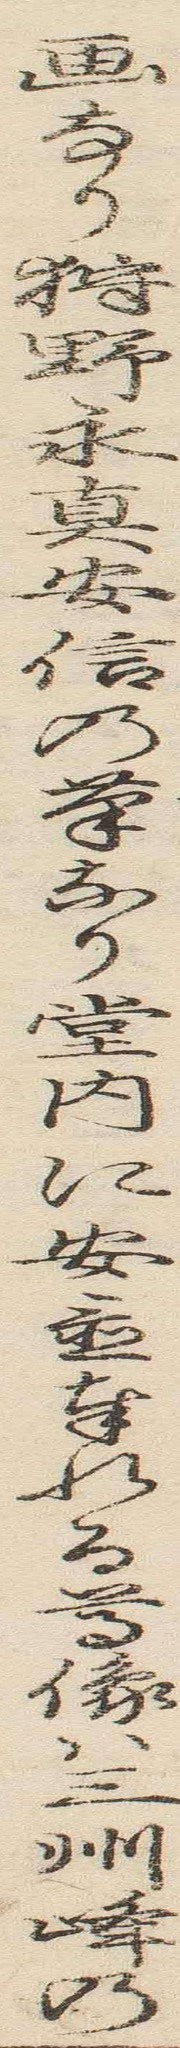画なり狩野永真安信の筆なり堂内に安置奉れる尊像は三州峰の
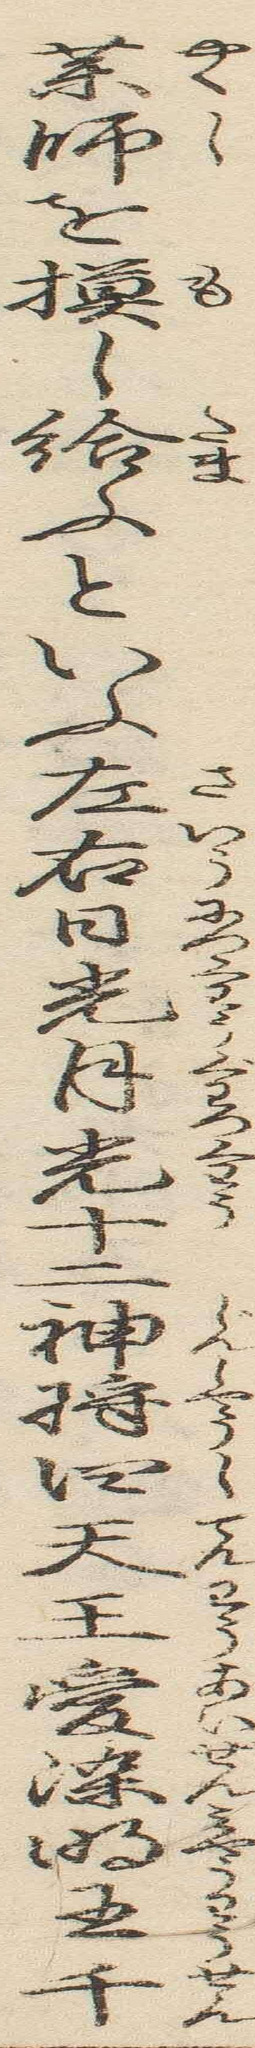薬師を摸し給ふといふ左右日光月光十二神将四天王愛染明王千
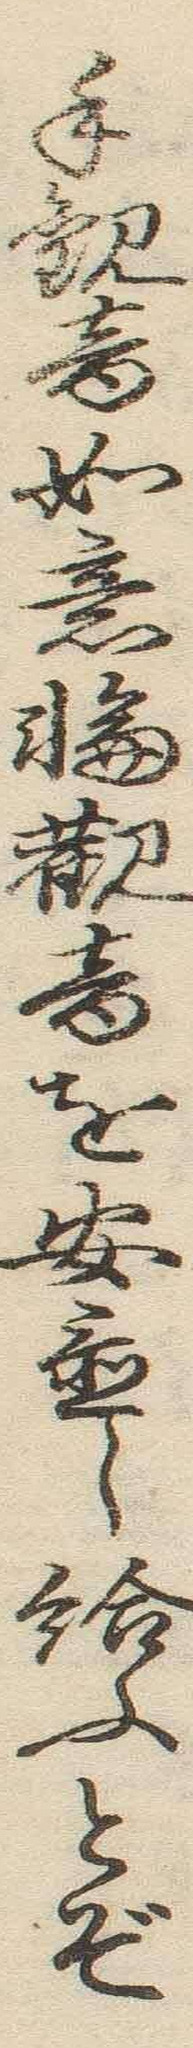手觀音如意輪觀音を安置し給ふとぞ
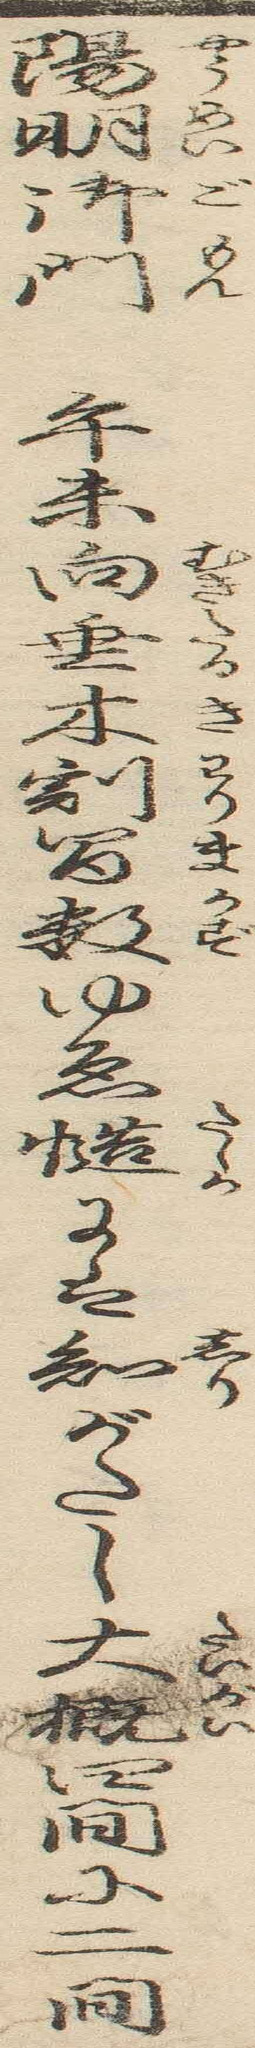陽明御門午未向垂木割間数ゆゑ慥には知がたし大概四間に二間
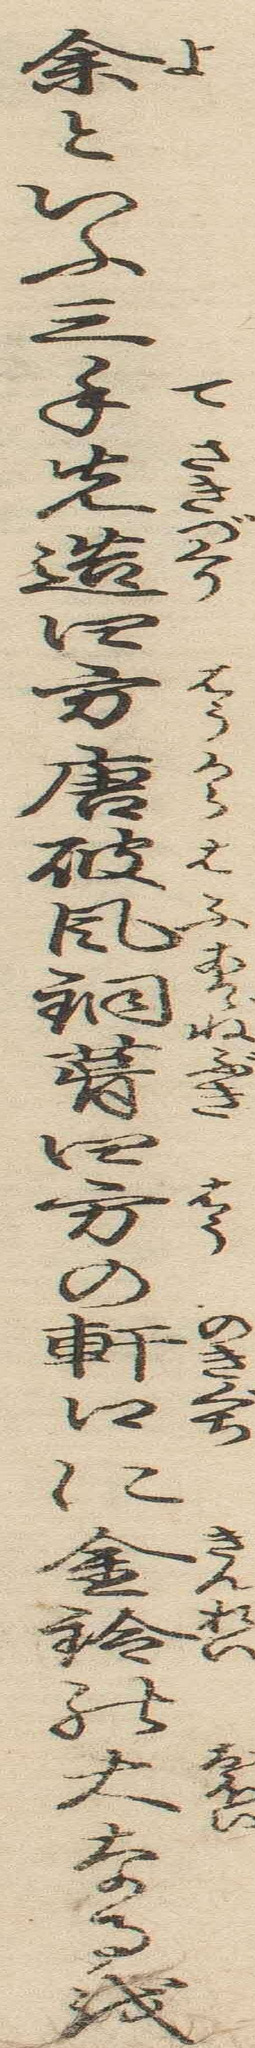余といふ三手先造四方唐破風銅葺四方の軒口に金鈴の大なるを

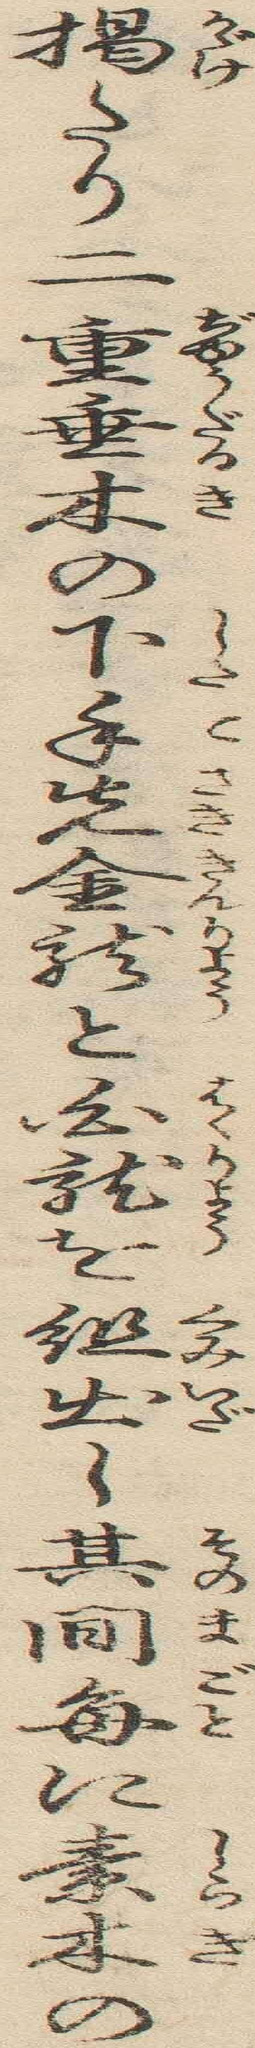掲たり二重垂木の下手先金龍と白龍を組出し其間每に素木の
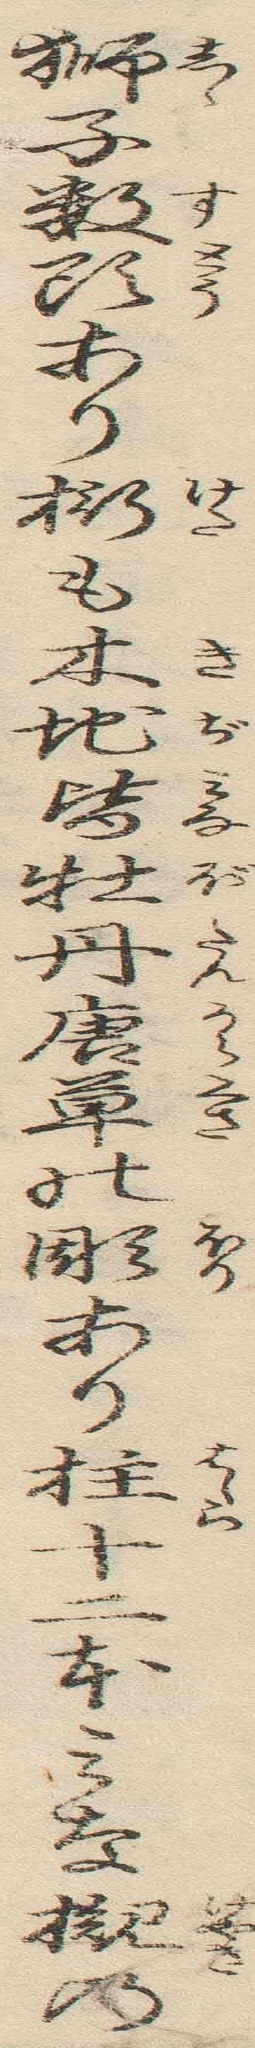獅子数頭あり桁も木地皆牡丹唐草の彫あり柱十二本みな槻の
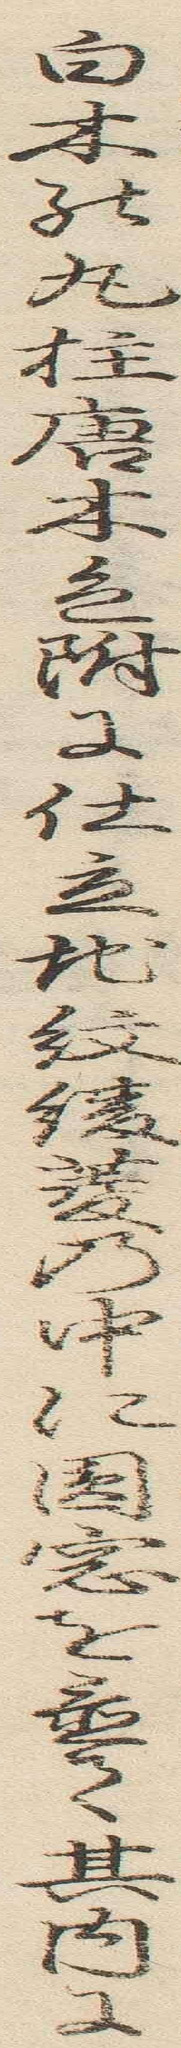白木の丸柱唐木色附に仕立地紋綾菱の中に圓窓を置て其内に
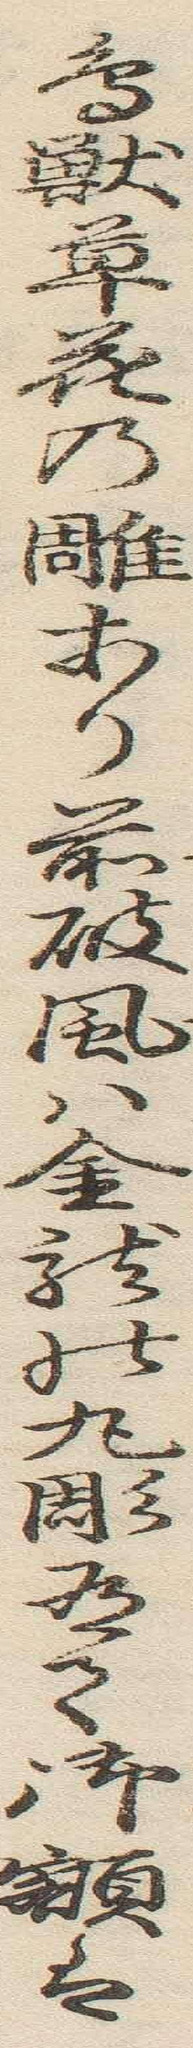鳥獣草花の雕あり前破風は金龍の丸彫有て御額は
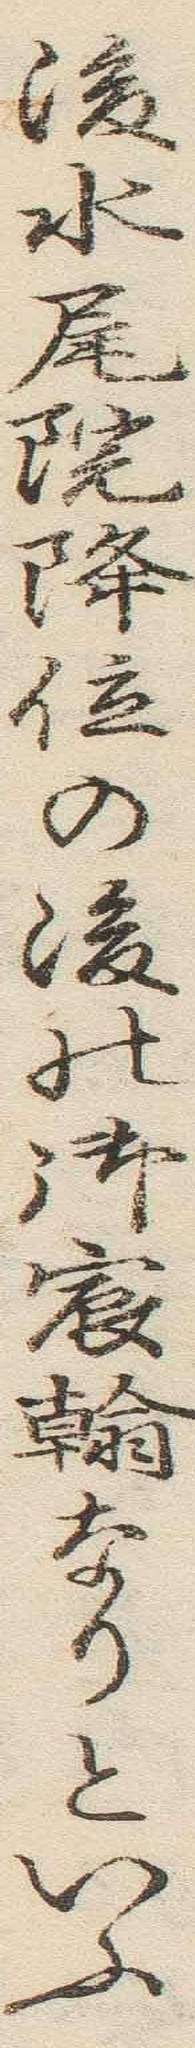後水尾院降位の後の御宸翰なりといふ
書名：日光山志
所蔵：東京学芸大学附属図書館 国文学研究資料館
